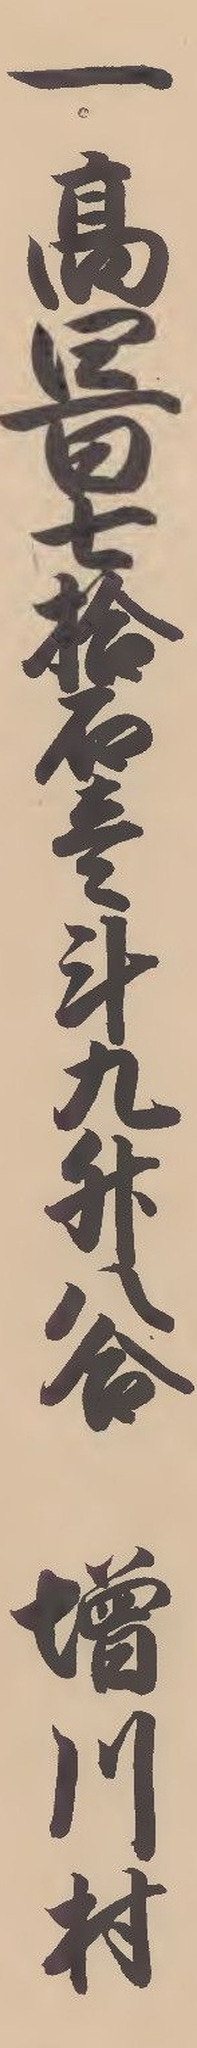一高四百七拾石壱斗九升八合増川村
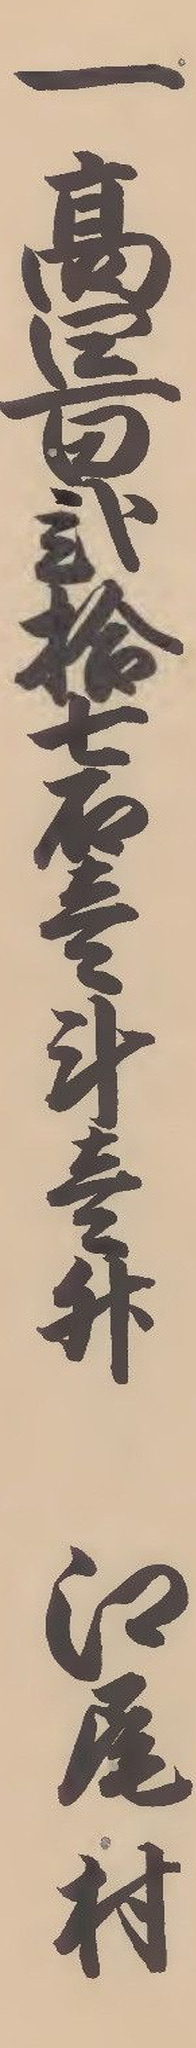一高四百弐拾七石壱斗壱升江尾村
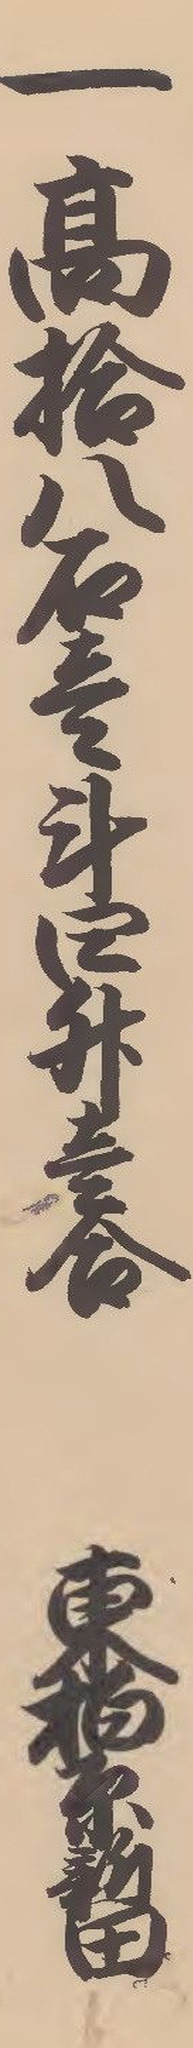一高拾八石壱斗四升壱合東柏原新田
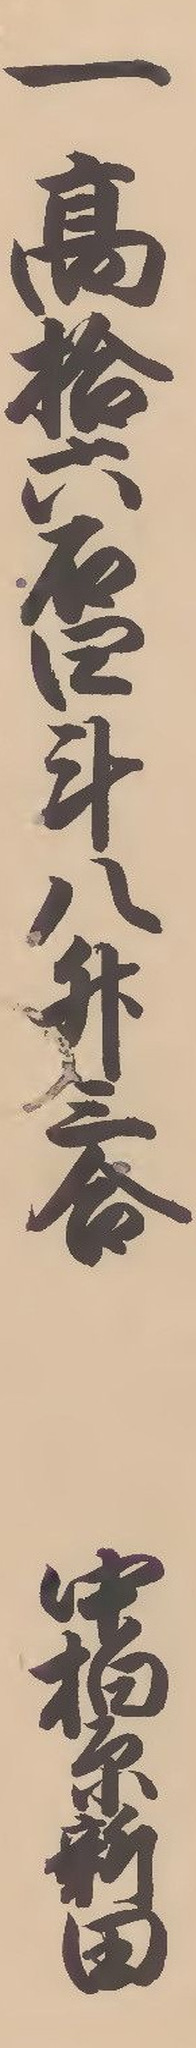一高拾六石四斗八升三合中柏原新田

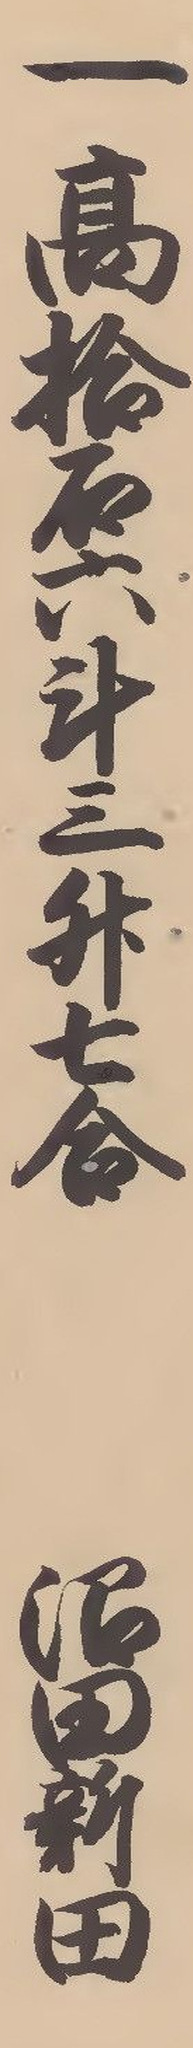一高拾石六斗三升七合沼田新田
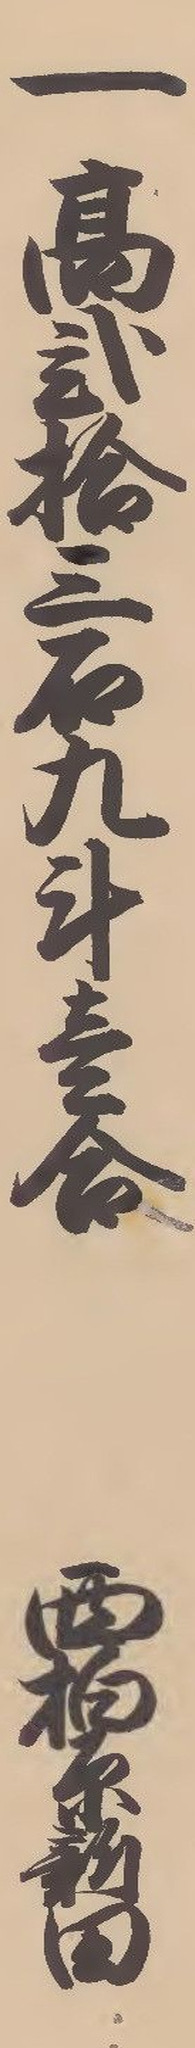一高弐拾三石九斗壱合西柏原新田
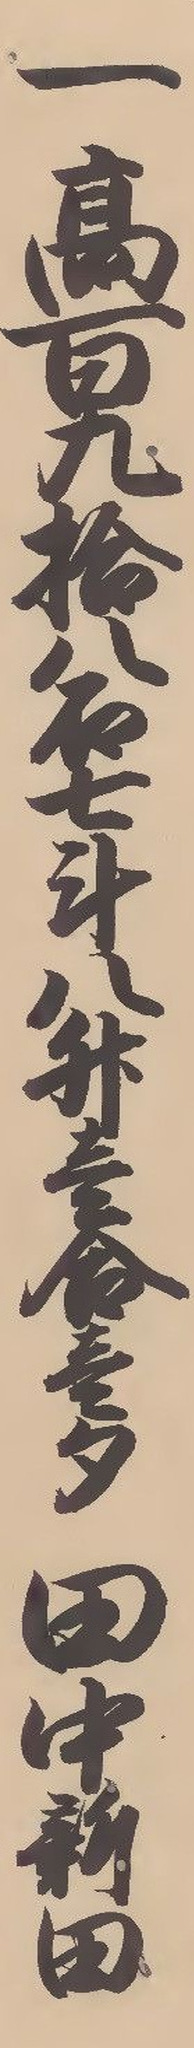一高百九拾八石七斗八升壱合壱勺田中新田
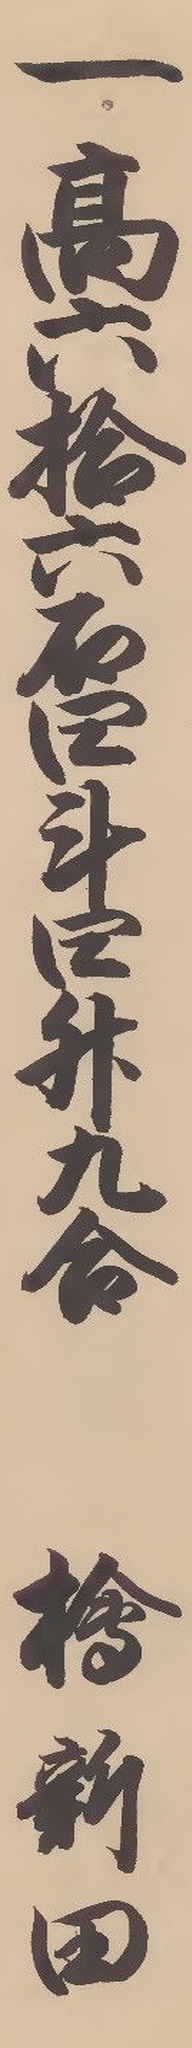一高六拾六石四斗四升九合桧新田
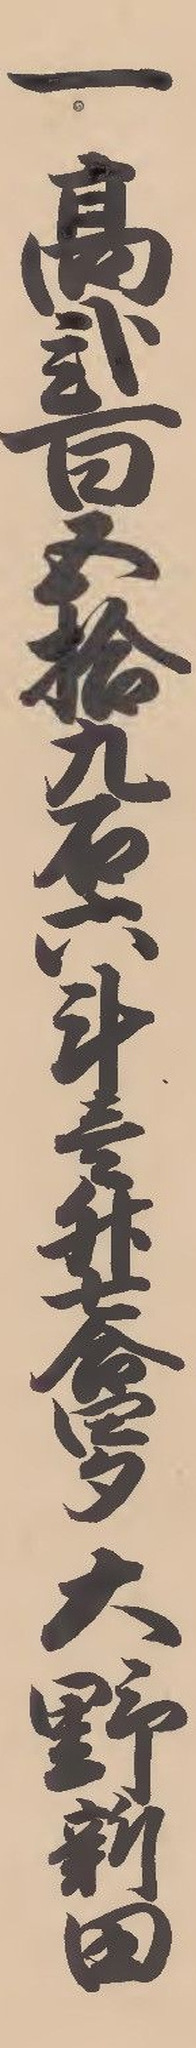一高弐百五拾九石六斗壱升七合四勺大野新田
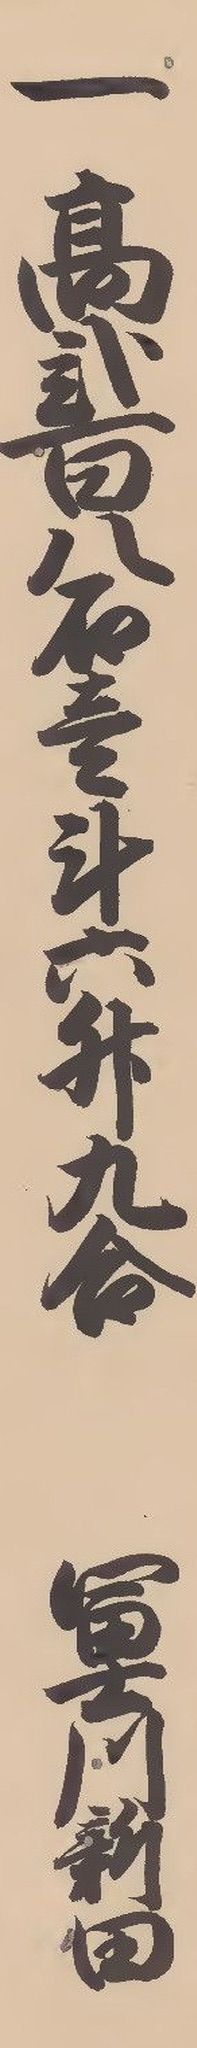一高弐百八石壱斗六升九合富士川新田
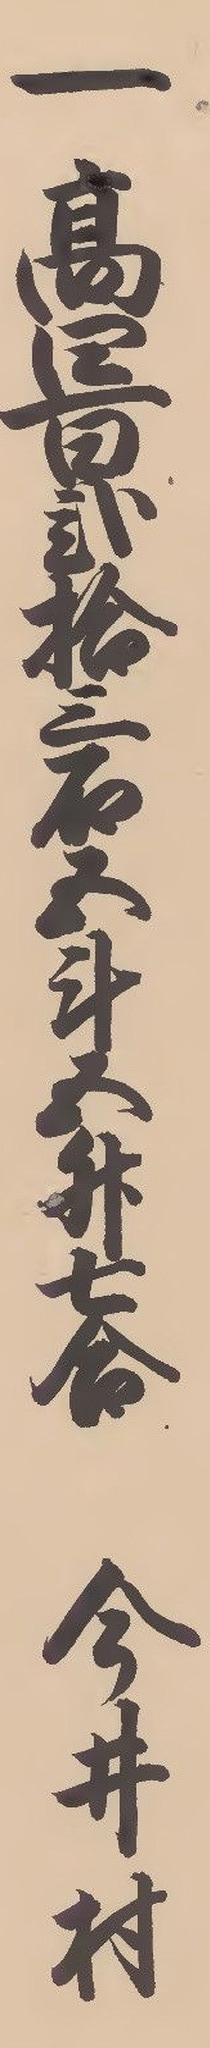一高四百弐拾三石五斗五升七合今井村
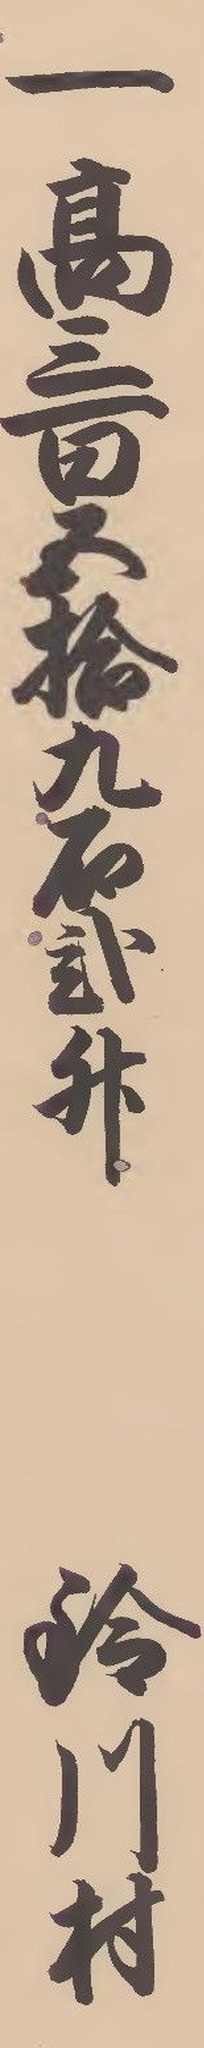一高三百五拾九石弐升鈴川村

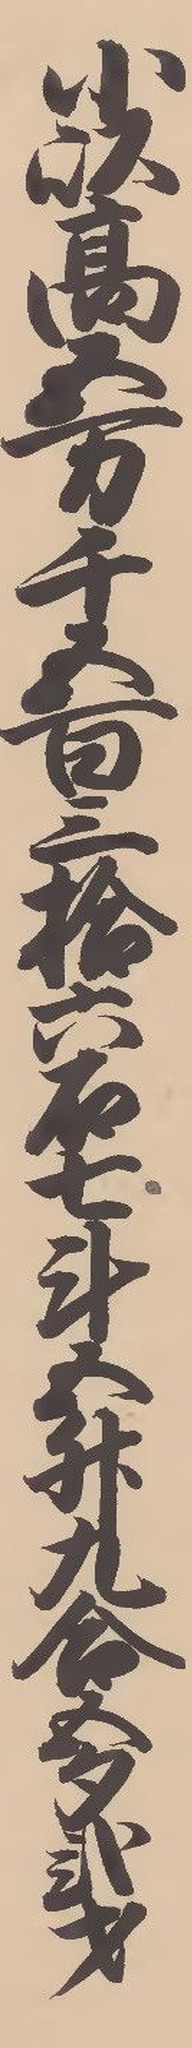小以高五万千五百三拾六石七斗五升九合五勺弐才
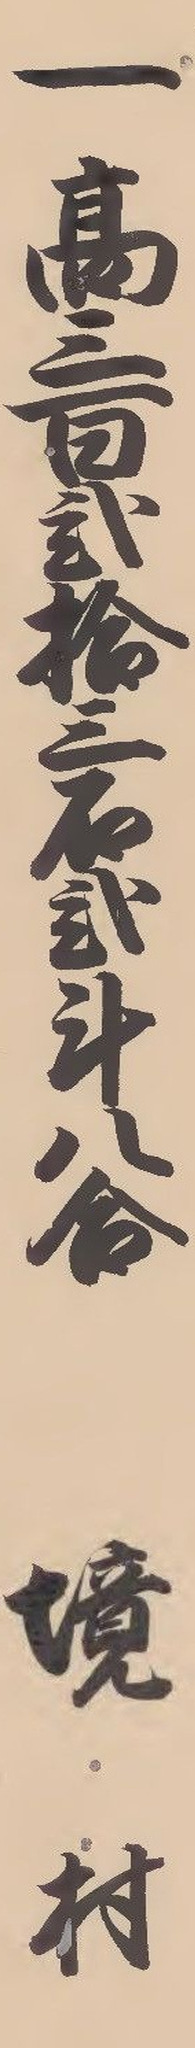一高三百弐拾三石弐斗八合境村
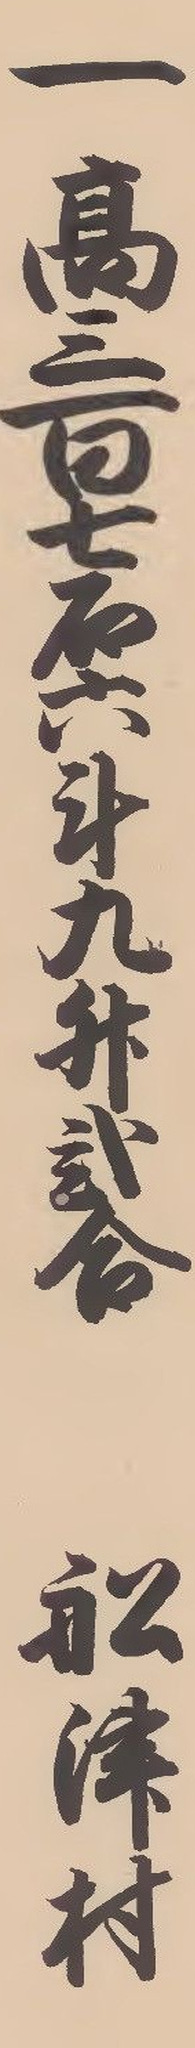一高三百七石六斗九升弐合船津村

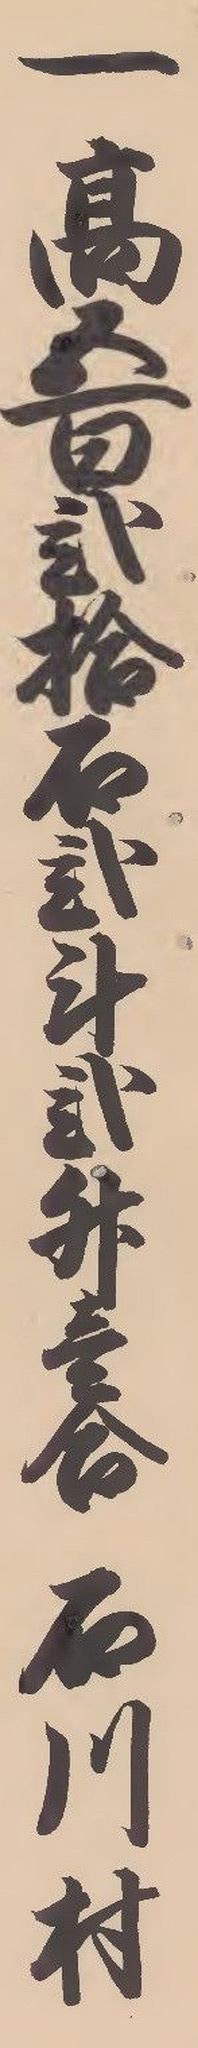一高五百弐拾石弐斗弐升壱合石川村
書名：駿河国郷帳
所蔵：国立公文書館 National Archives of Japan
